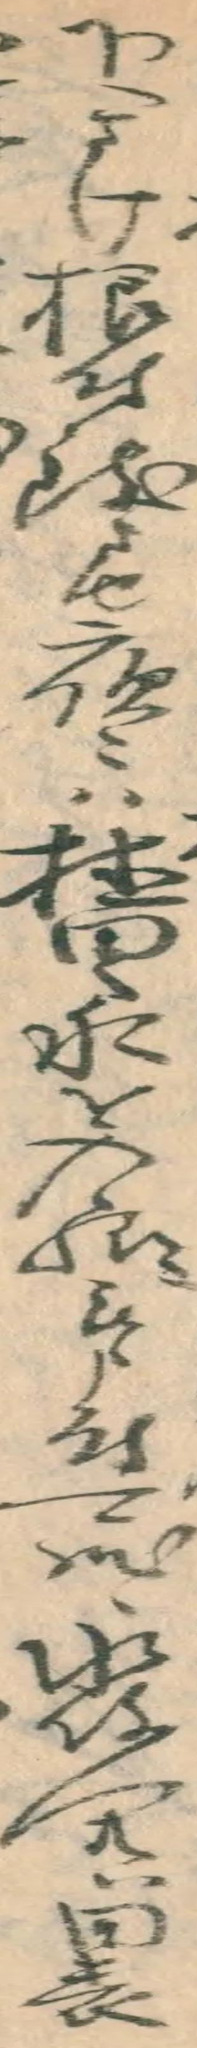下へさけ根付致させ夜々ハ植田へ水を入候様ニ被申付可然候水役人共ハ田表
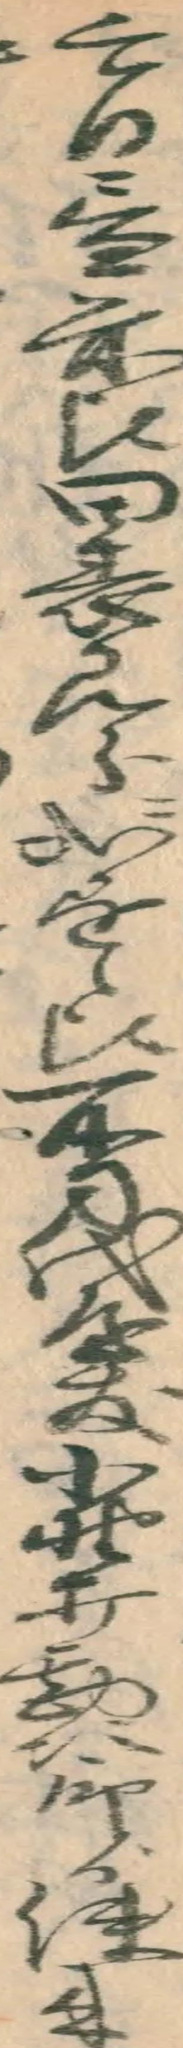一今日昼前比田表見分ニ出懸候比所司代屋敷小野打勘次郎ゟ使来
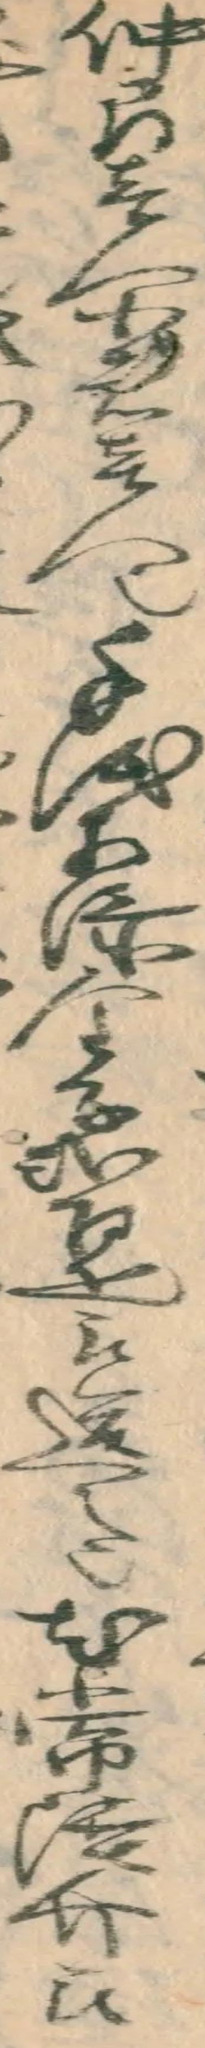仲間壱人小者壱人也手紙相添金子弐百疋被送之也尤常陸介被
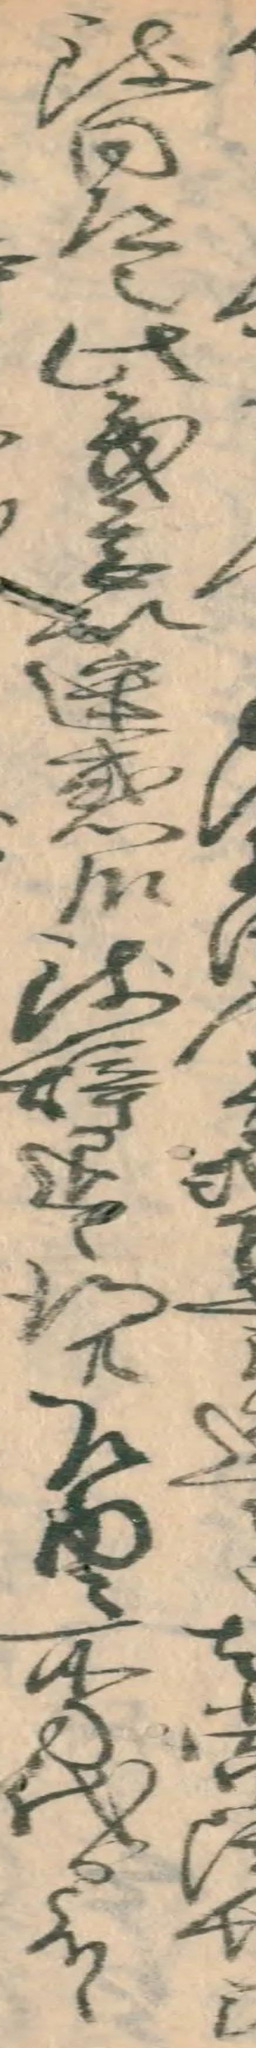致同道也此義甚以迷惑故致辞退候得共乍内々所司代ゟ被下候
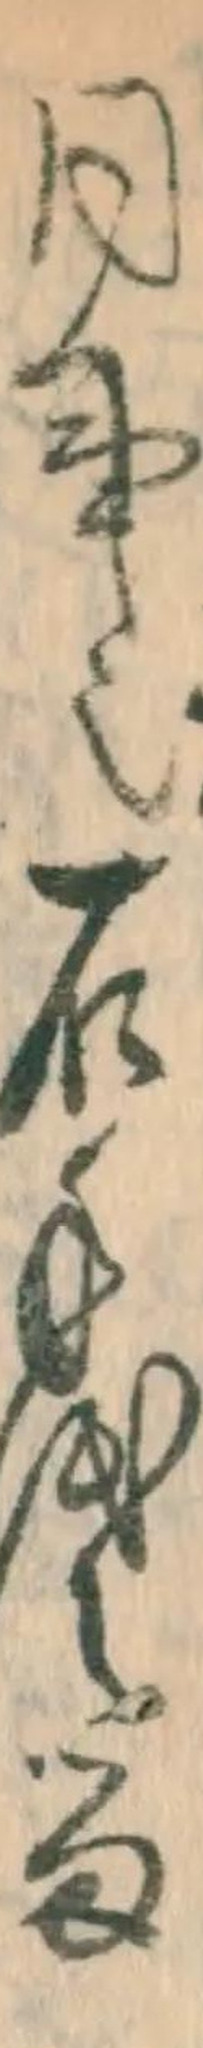同事也右手紙之留
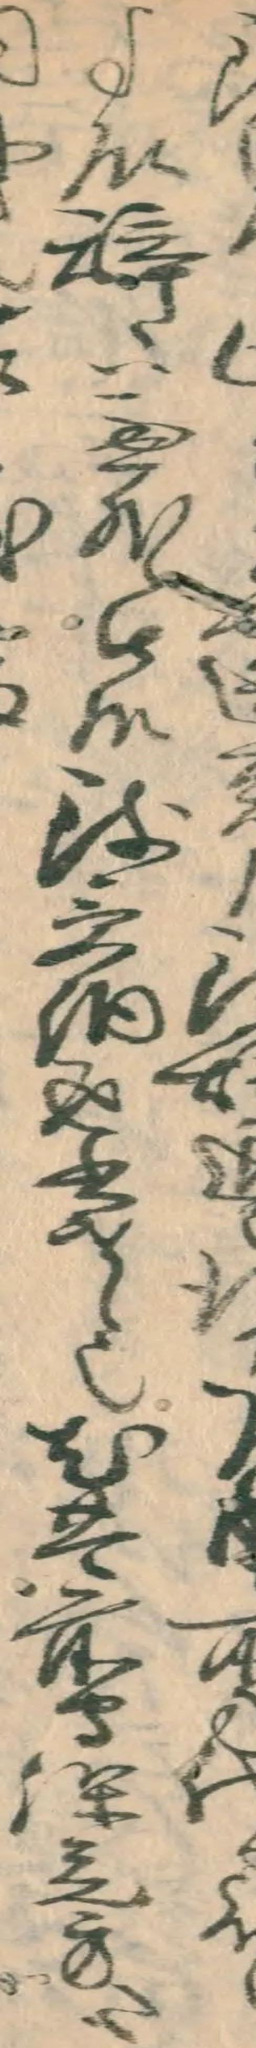事故辞候ハ慮外候由故致受納返書遣候也尤豊前守保覚方へも
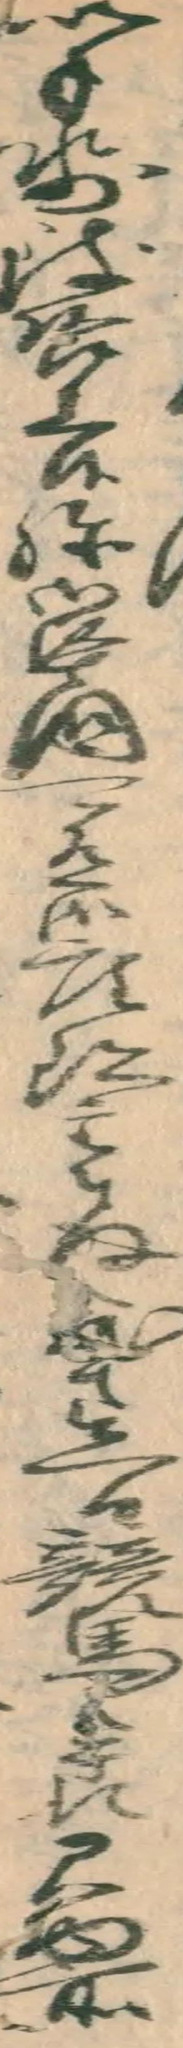以手紙致啓上候弥御堅固可有御座珍重奉存候然者先日競馬之節見物所
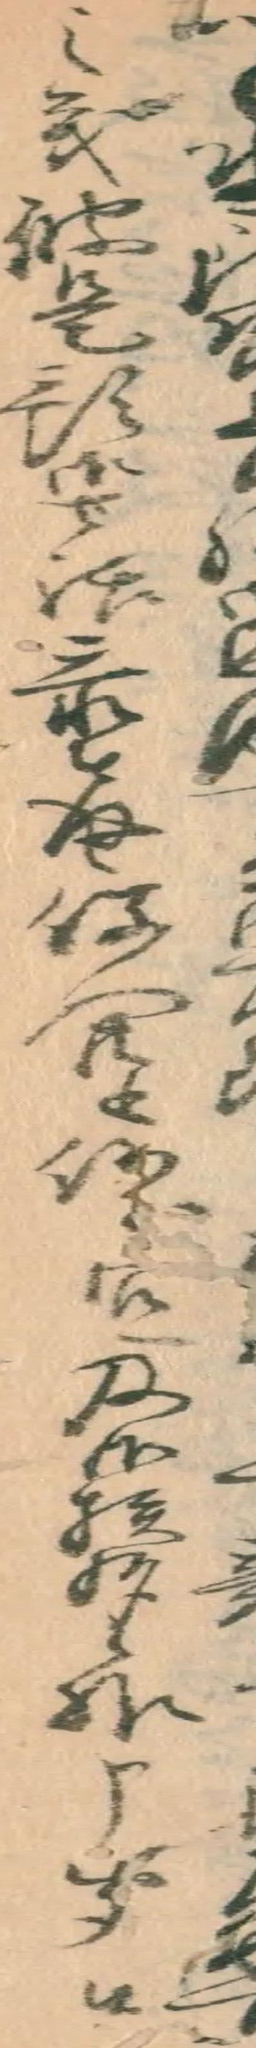之義彼是預御世話忝奉存候役人共も何分宜及御挨拶候様申聞候
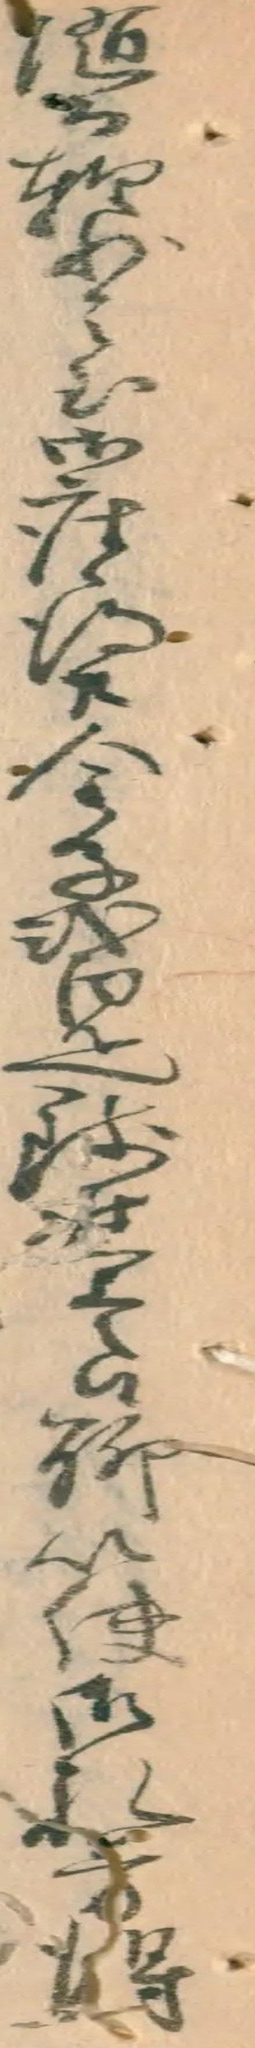随而軽少之至御座候得共金子弐百疋致進上候聊以使御礼方得
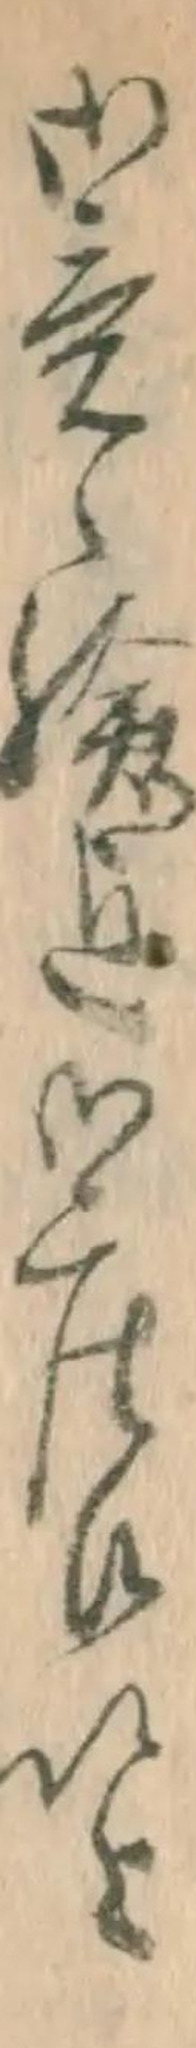御意候驗迄御座候以上
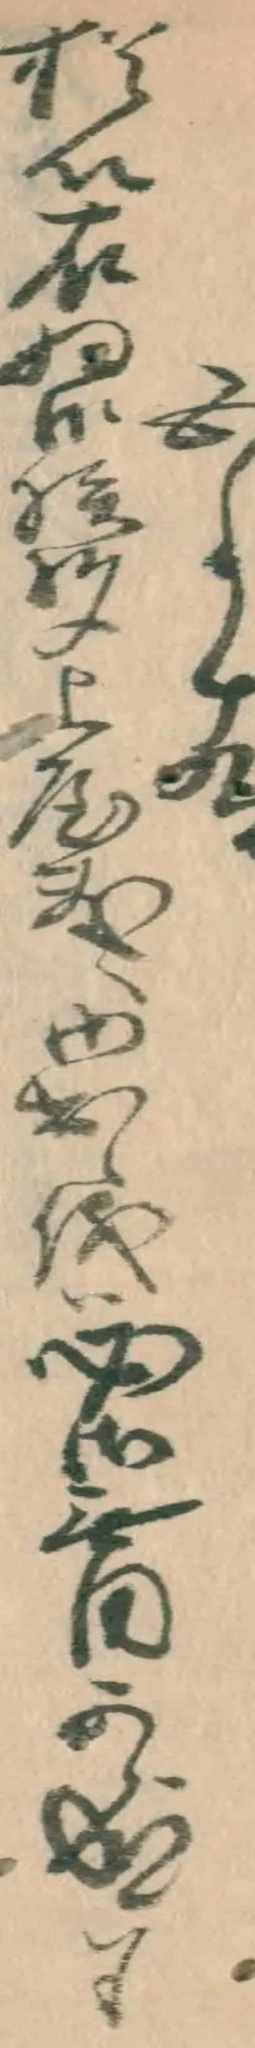猶以右為御挨拶上屋敷へ御出候儀ハ必御無用可被成候以上
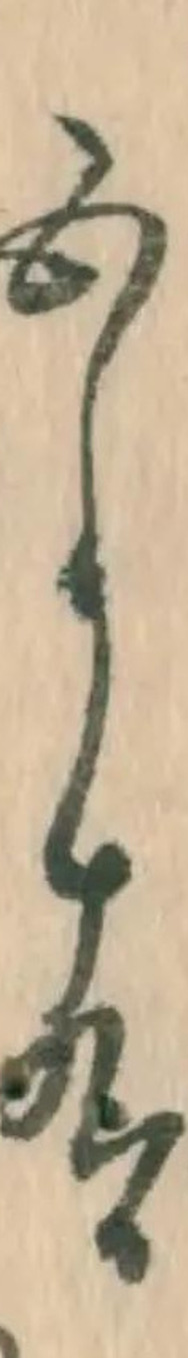五月十九日
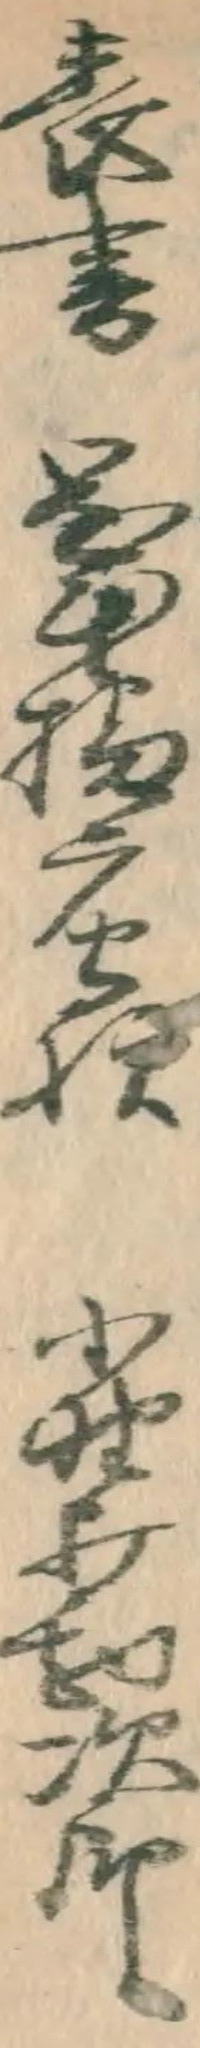表書岡本播磨守様小野打勘次郎
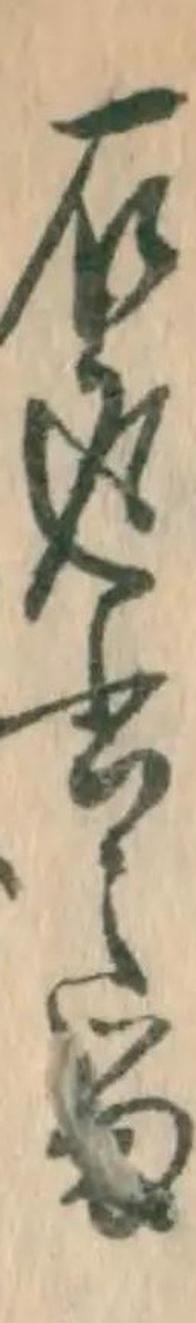右返書之留
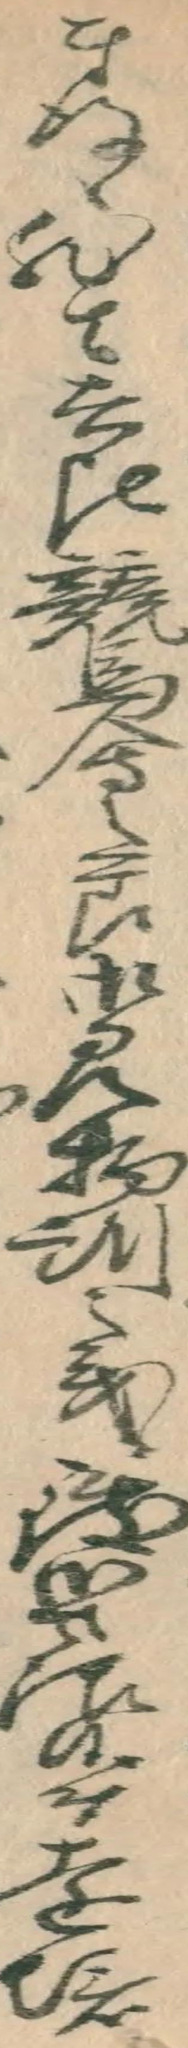奉存候然者去比競馬会之節御見物所之義致御世話候ニ付遠境
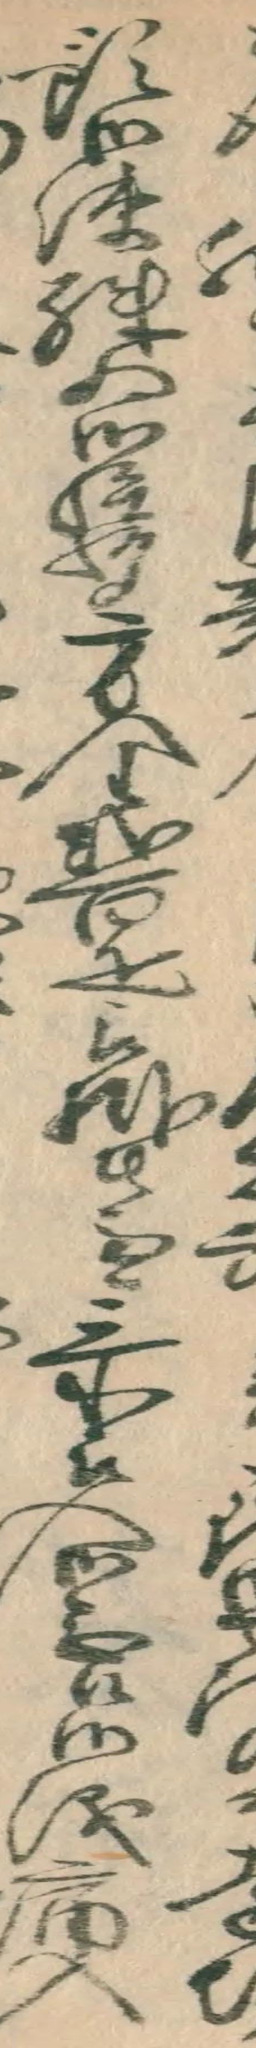預御使殊為御挨拶方金弐百疋被掛貴慮忝被入御念候御儀痛入
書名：賀茂社記録. 第58冊
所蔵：国立国会図書館 National Diet Library, JAPAN
